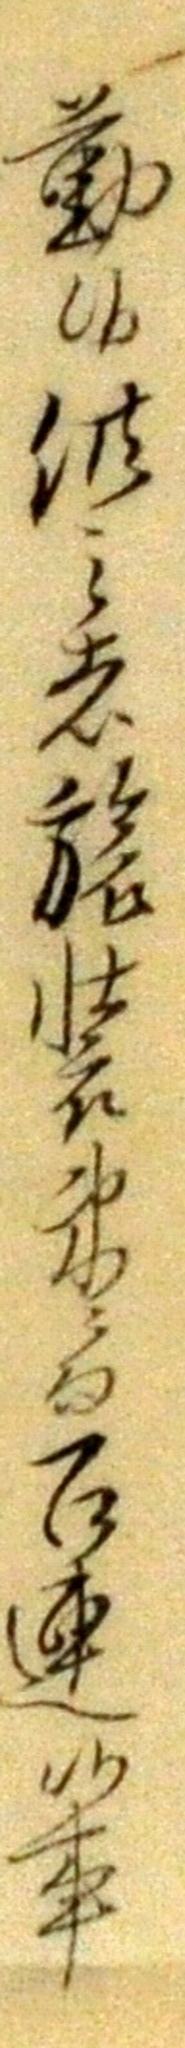勤候供之者旅装束ニ而召連候事
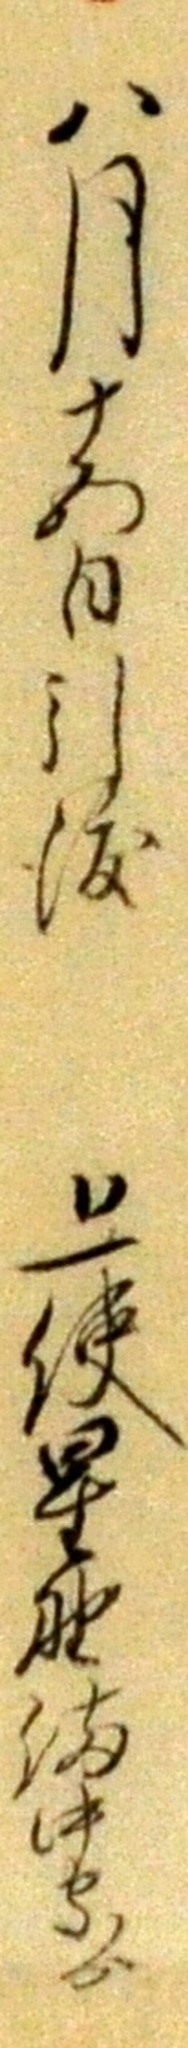八月十五日引渡上使星野備中守ゟ
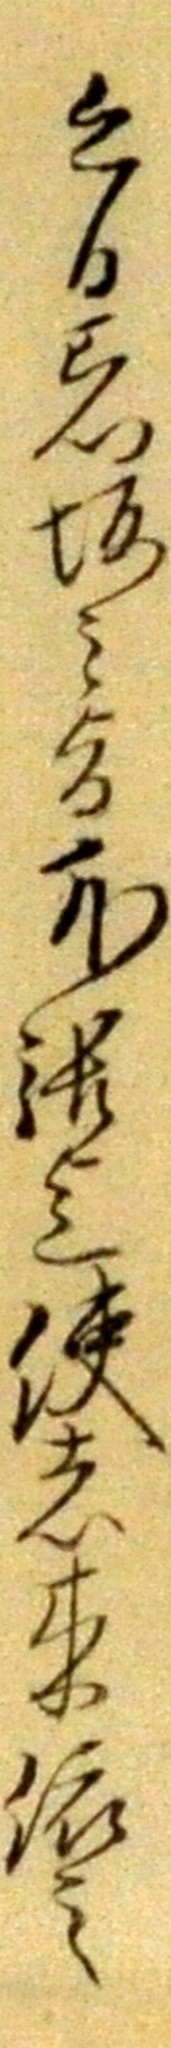今日着坂之旨外張迄使者来依之
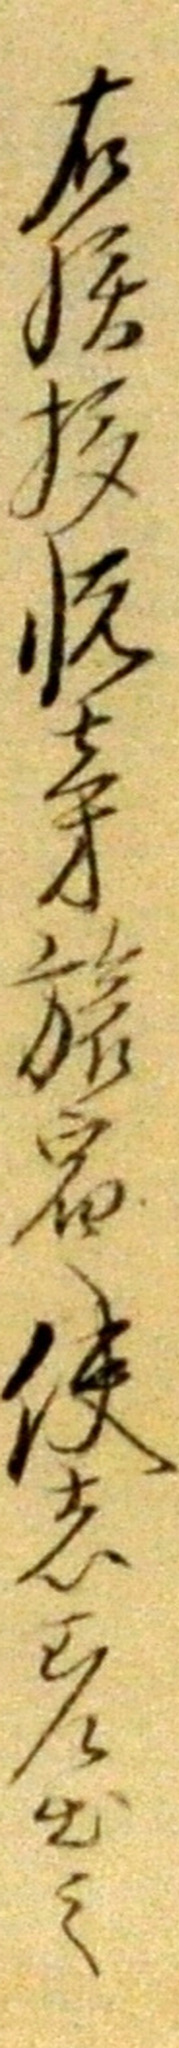右挨拶悦旁旅宿使者差出之
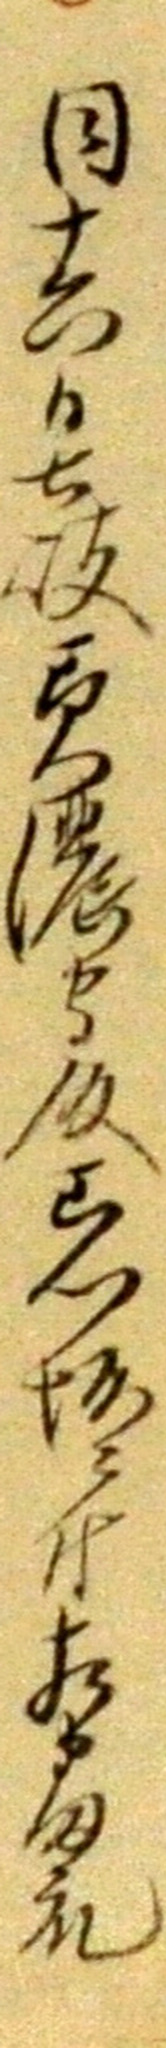同十六日土岐美濃守殿着坂ニ付相番衆
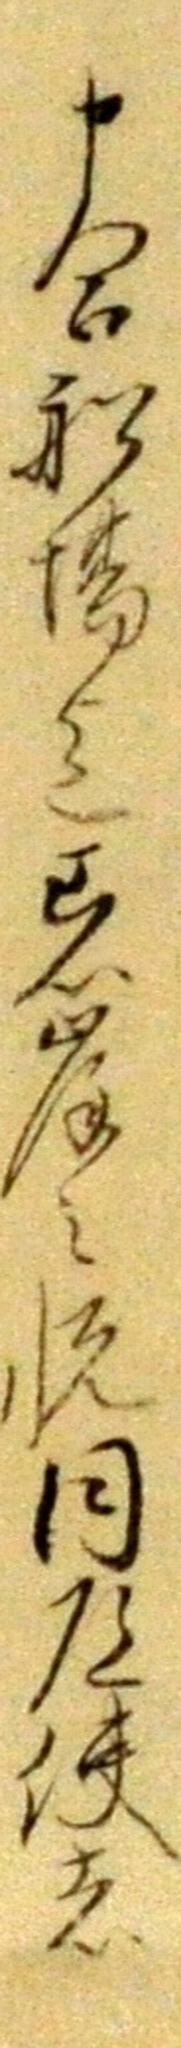申合船場迄着岸之悦同道使者
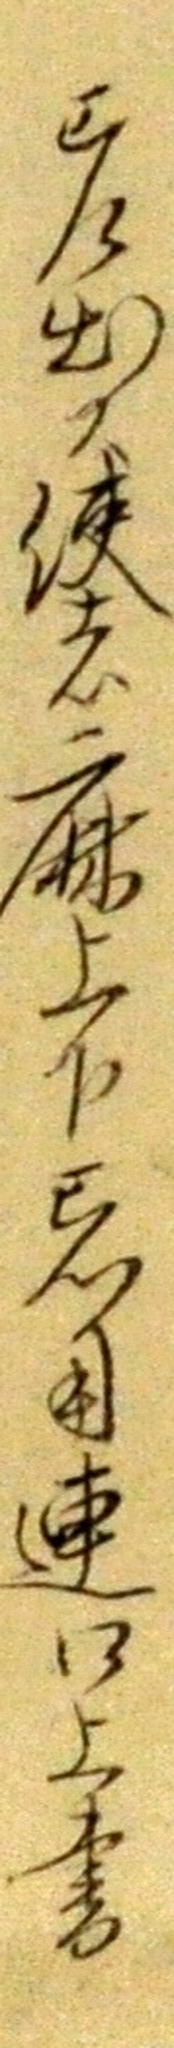差出ス使者麻上下着用連口上書
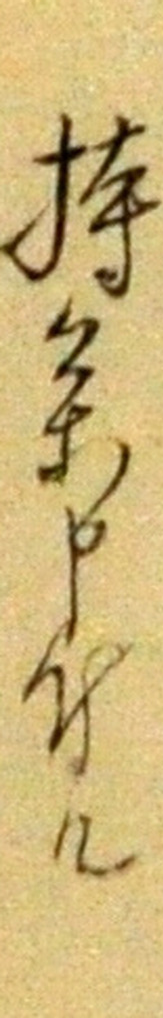持参申付ル
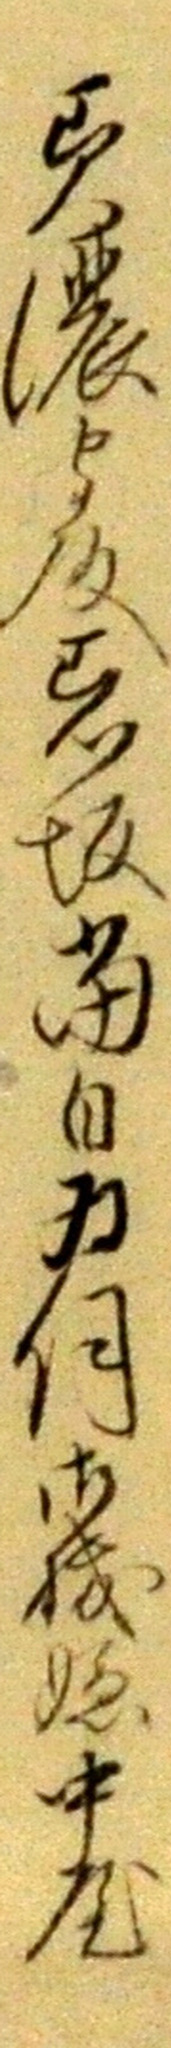美濃守殿着坂当日為伺御機嫌中屋
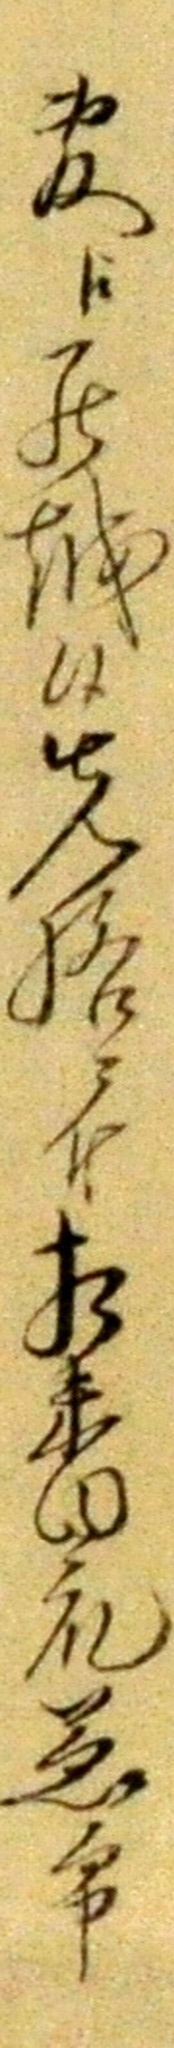敷え罷越候先格ニ付相番衆兼而申
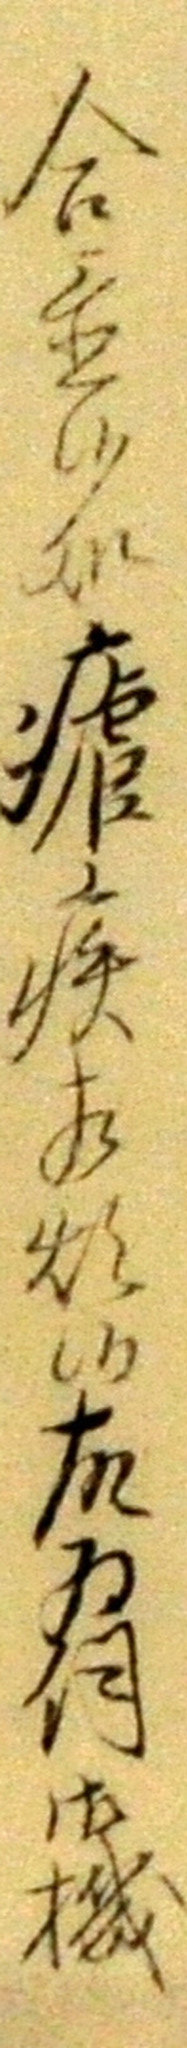合置候処瘧疾相煩候故為伺御機
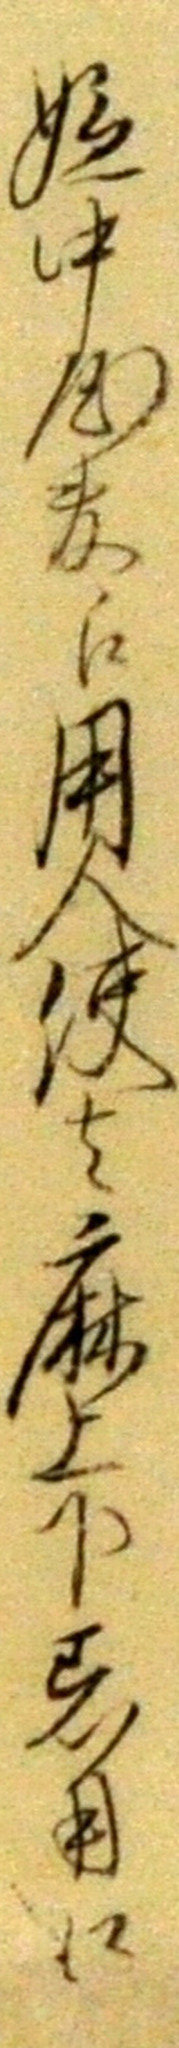嫌中屋敷え用人使者麻上下着用口
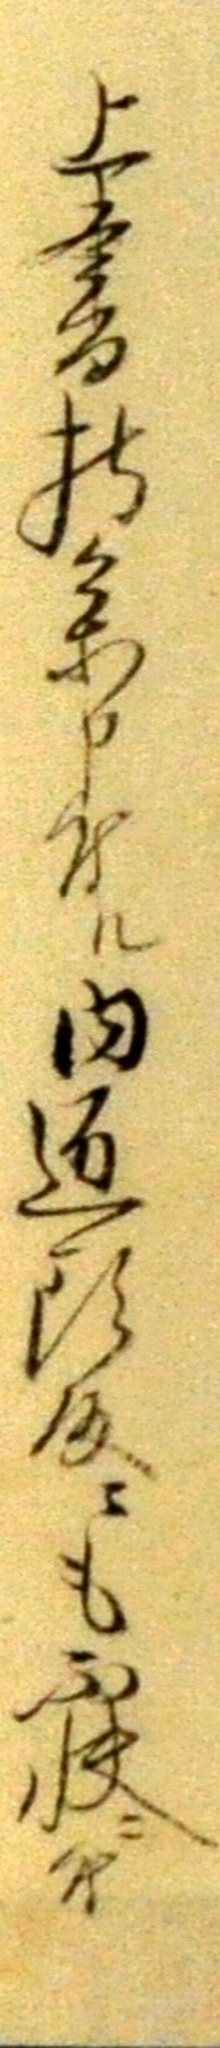上書持参申付ル内匠頭殿ニも不快二付

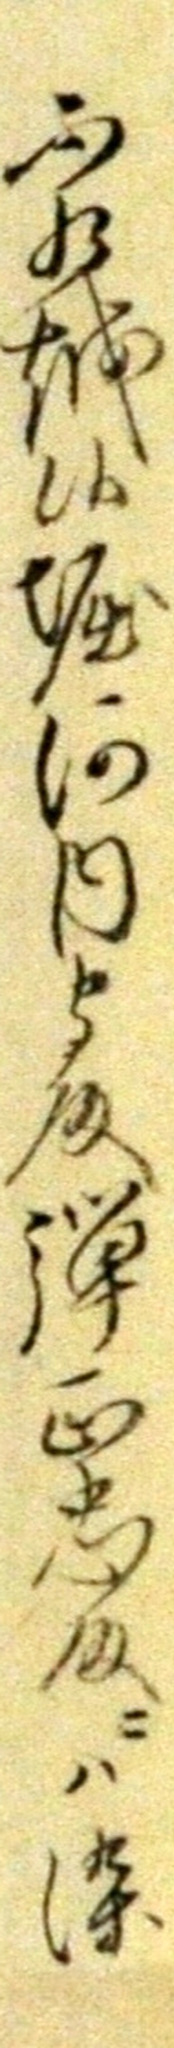不相越候堀河内守殿弾正忠殿ニハ染
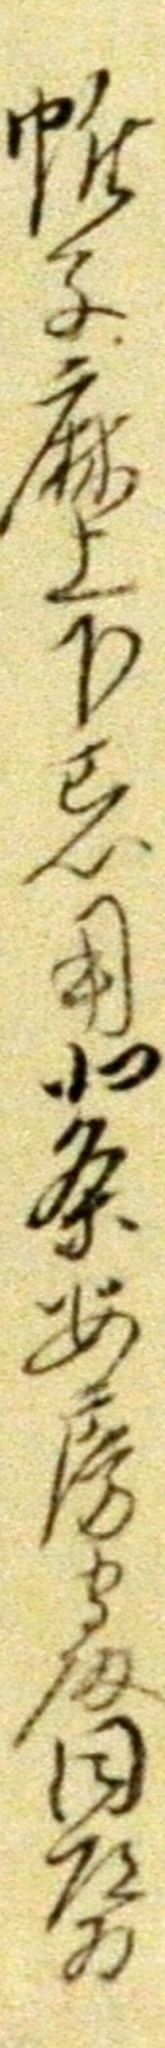帷子麻上下着用北条安房守殿同道為
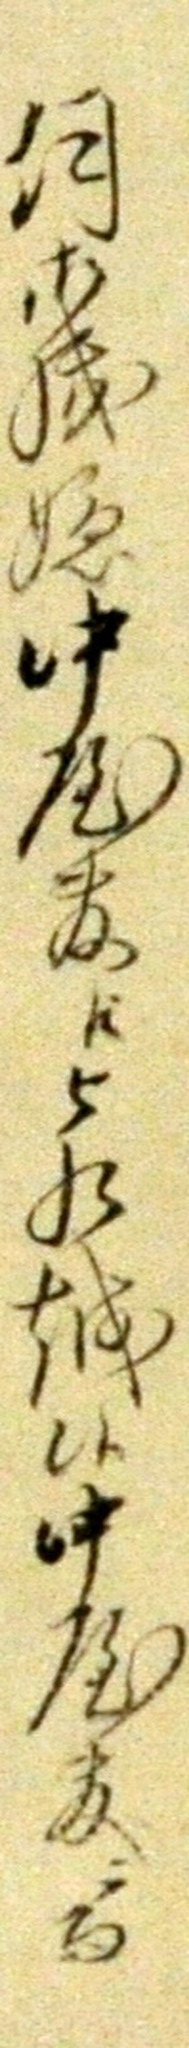伺御機嫌中屋敷え被相越候中屋敷ニ而
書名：大阪加番関係諸書留〔一括〕
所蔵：伊那市立高遠町図書館・合同会社AMANE
